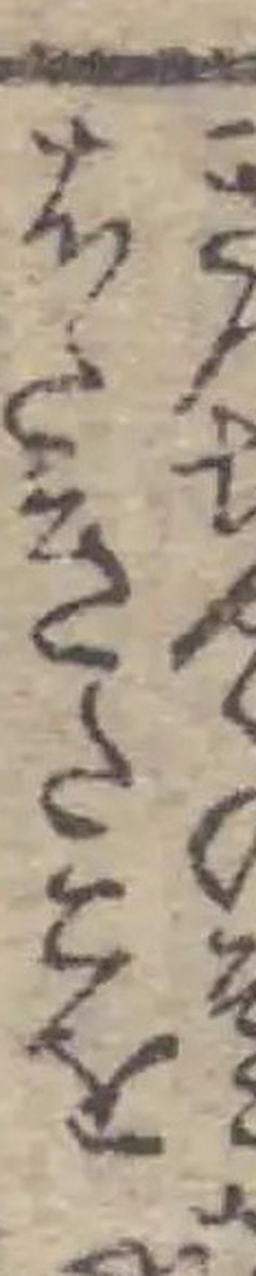はたきたこを
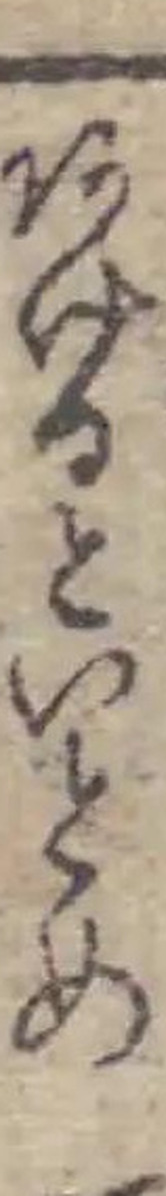あけるといとめ
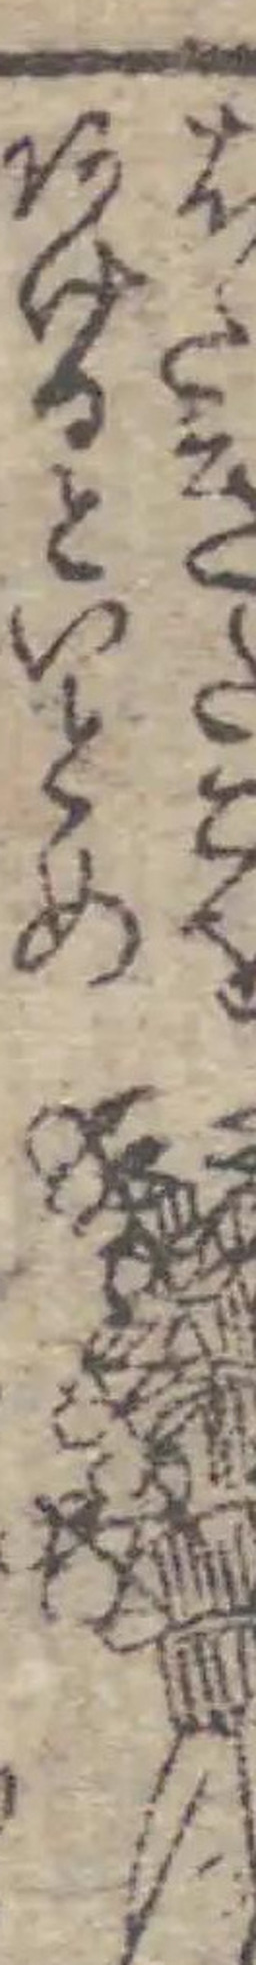あけるといとめ
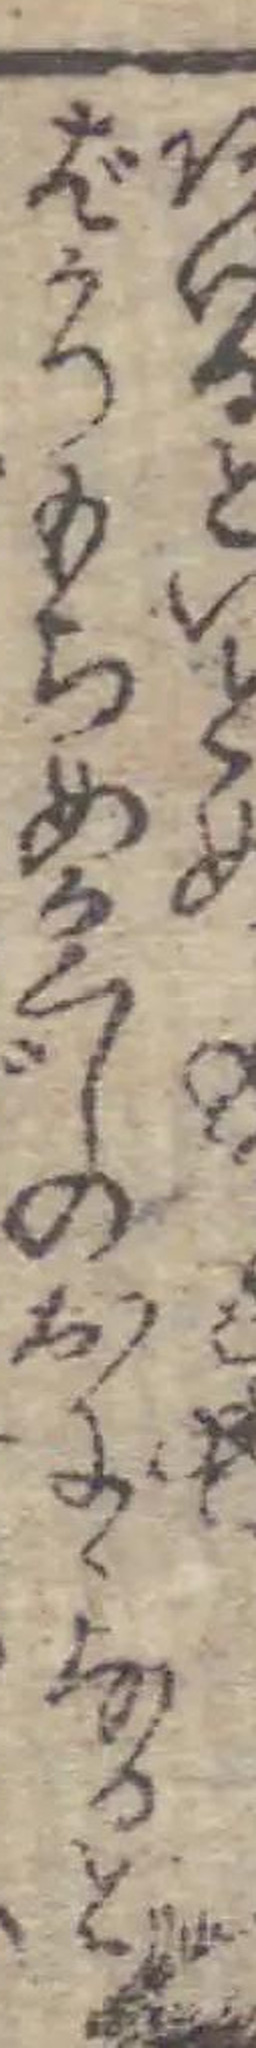ばかりもちめかくしのおにゝなると
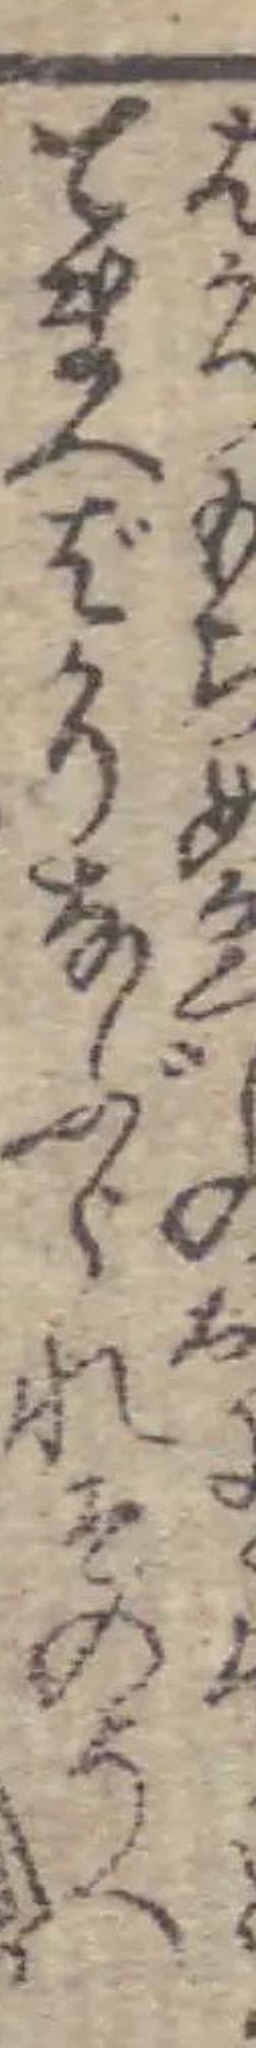てまへばかりなぶられそのうへ
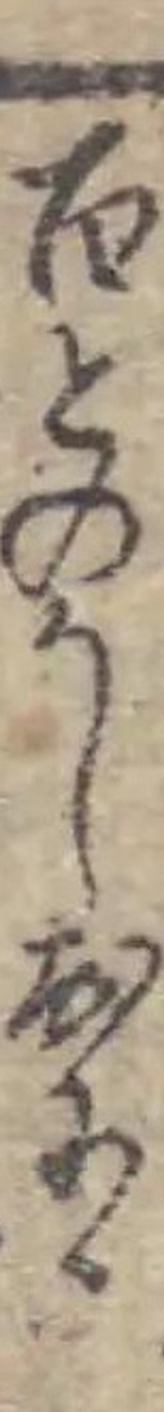百とのかしおにゝ
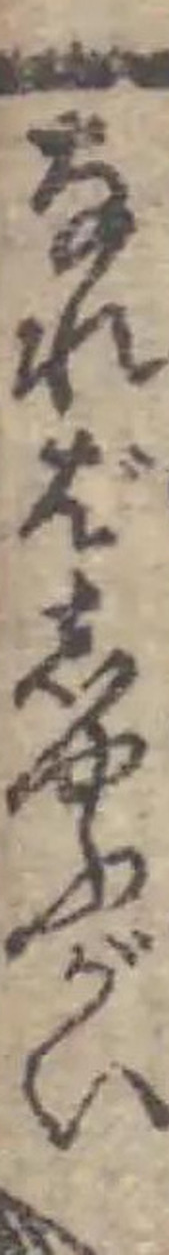なればしやふがい
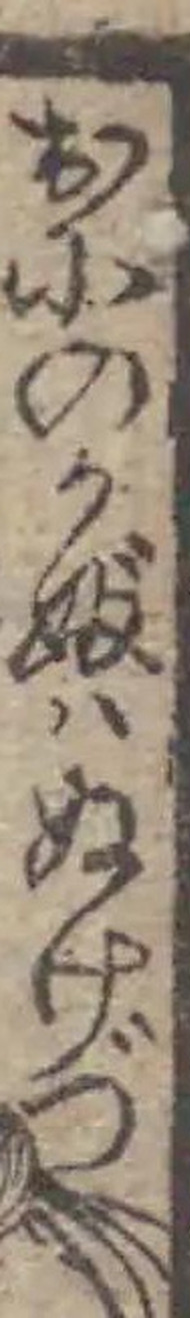おにのかぶはぬけづ
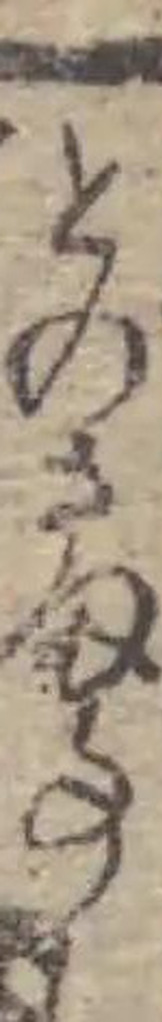とのさま事
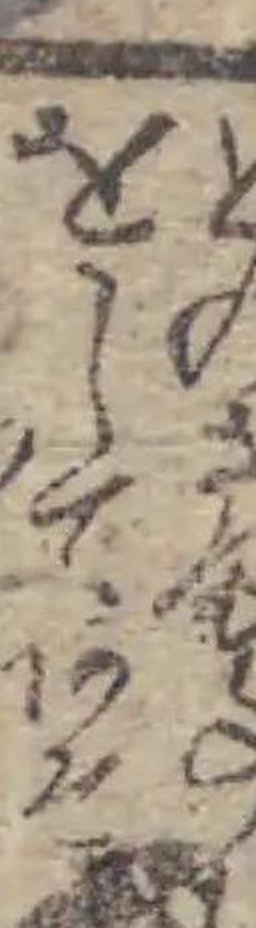をしてあそ
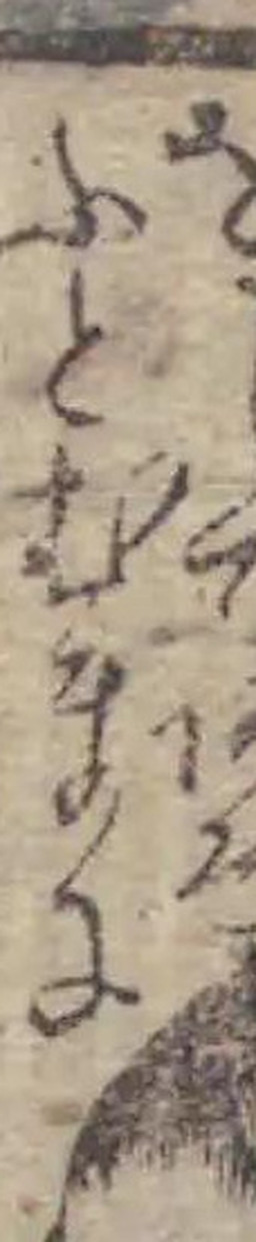ふとむまに
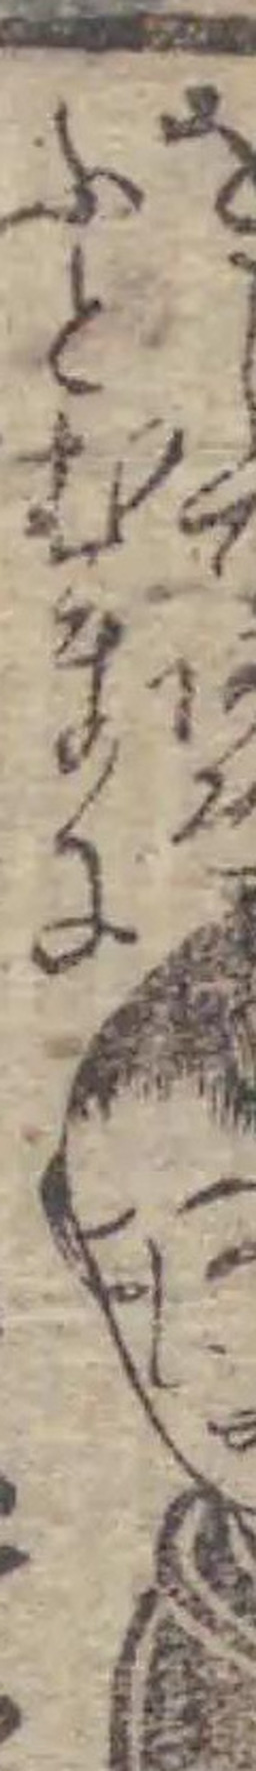ふとむまに
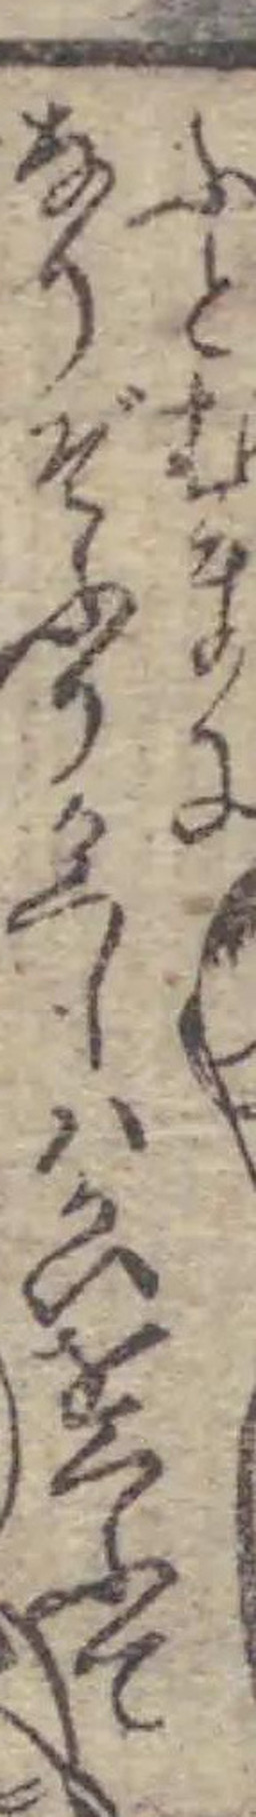なりぞふりかくしはかいをくふて
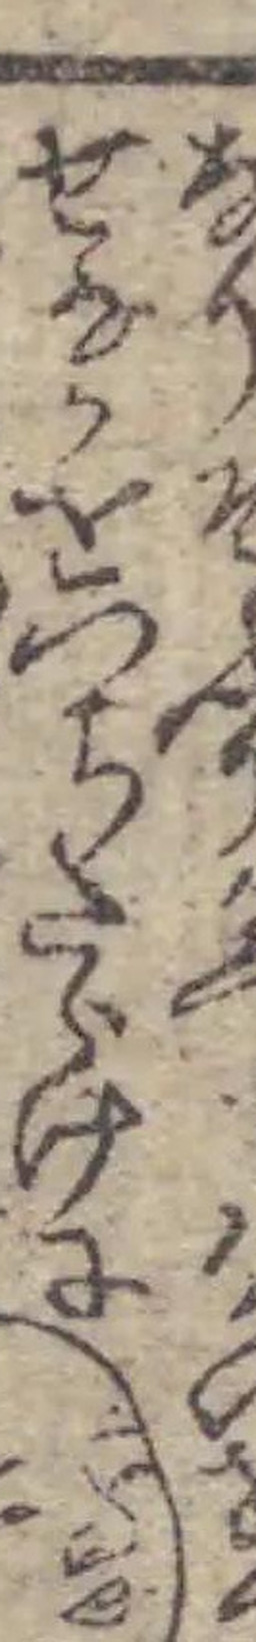せなかをつちたらけに
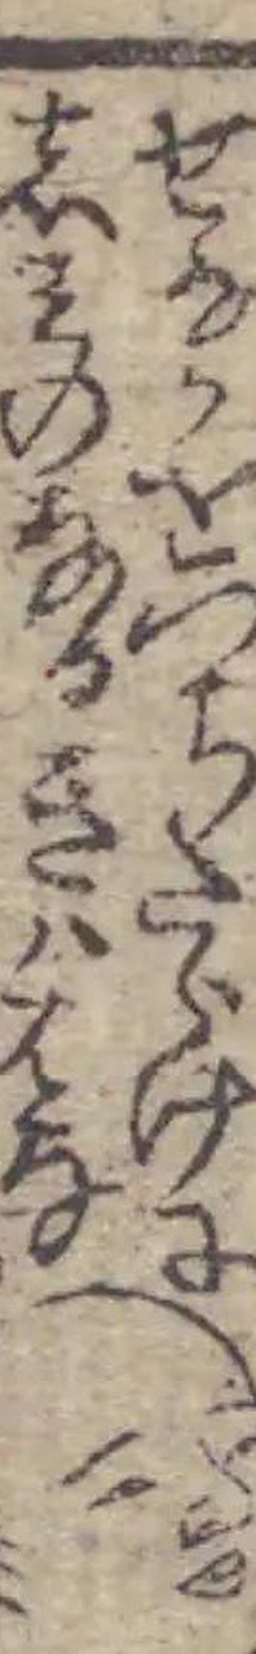しみのなるきははな
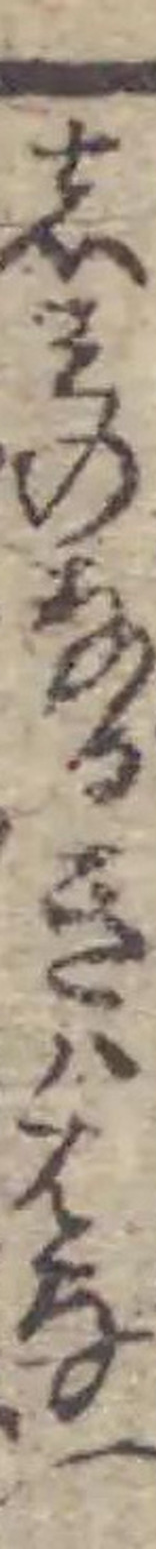しみのなるきははな
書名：津以曽無弟の甚六 3巻
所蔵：国立国会図書館 National Diet Library, JAPAN
